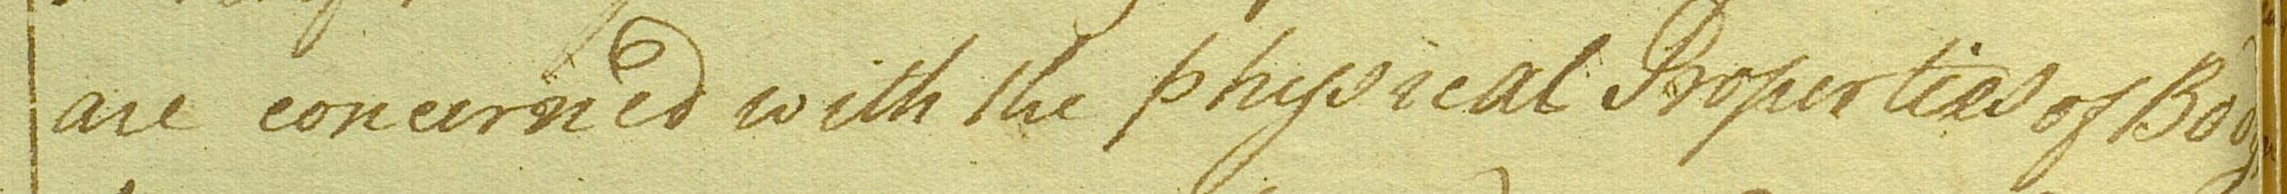are concerned with the physical Properties of Body
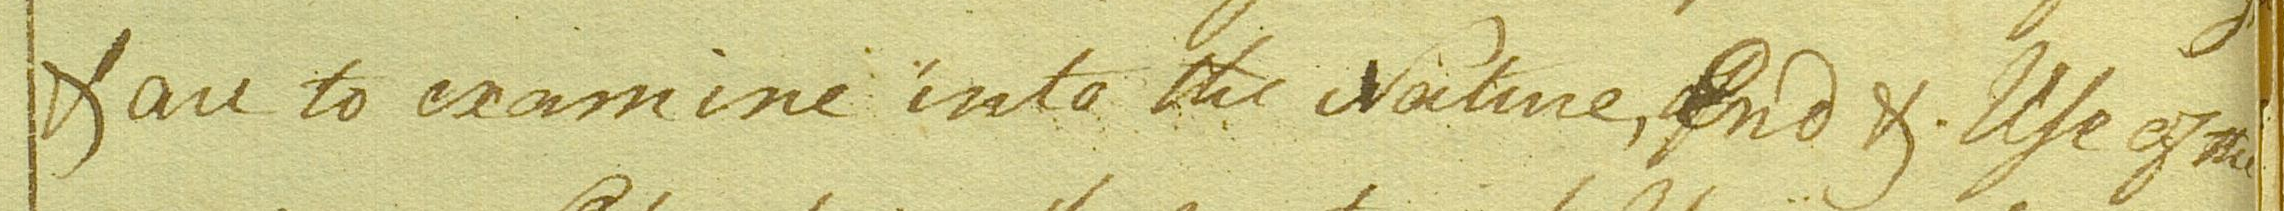& are to examine into the Nature, End & Use of the
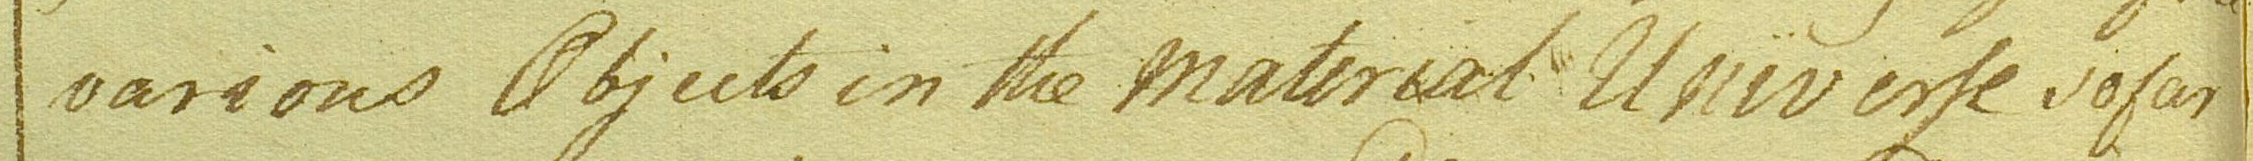various Objects in the Material Universe so far
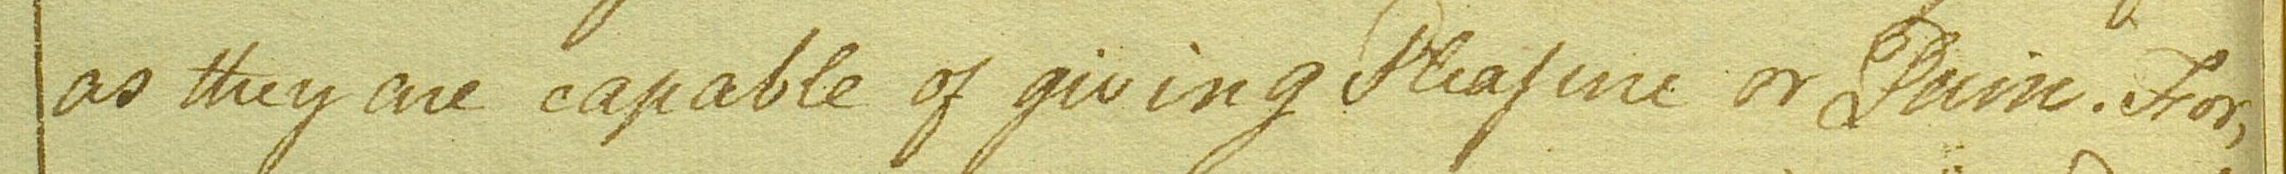as they are capable of giving Pleasure or Pain. For,
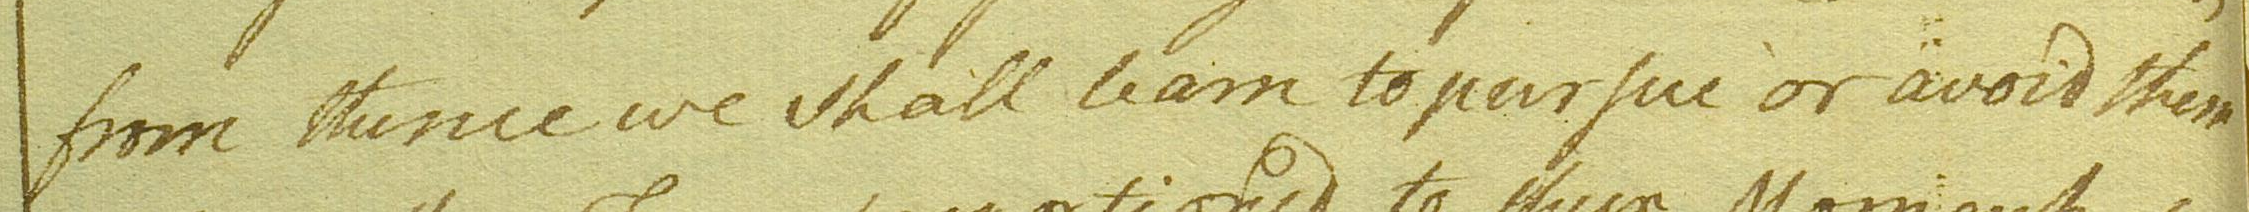form thence we shall learn to pursue or avoid them
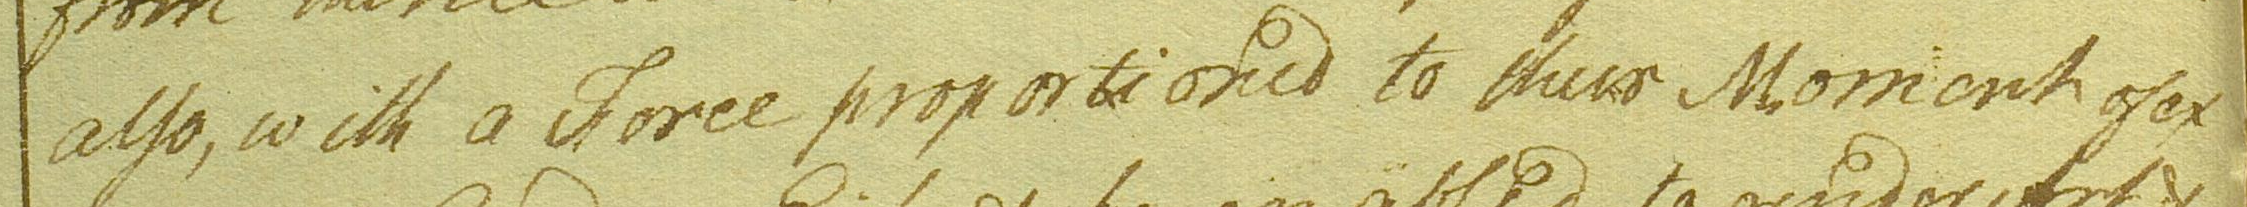also, with a Force proportioned to their Moment of ex
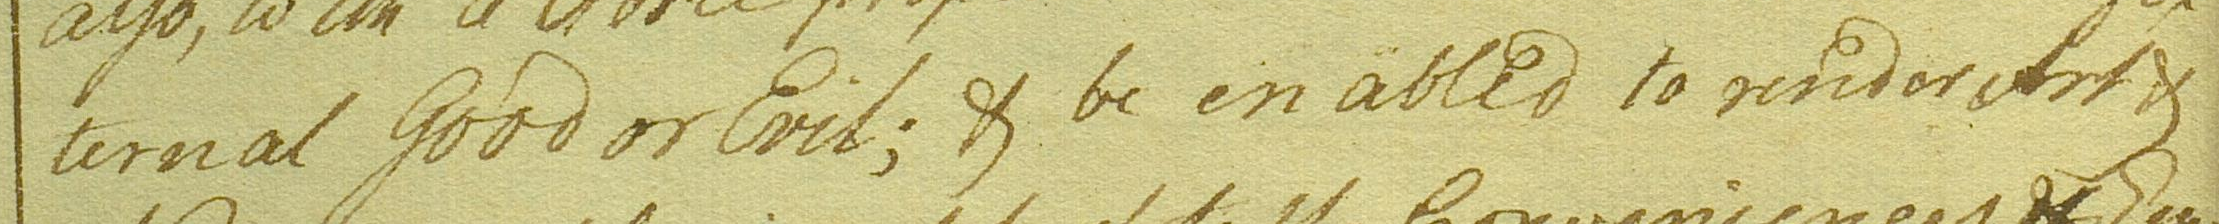ternal Good or Evil; & be enabled to render Art &
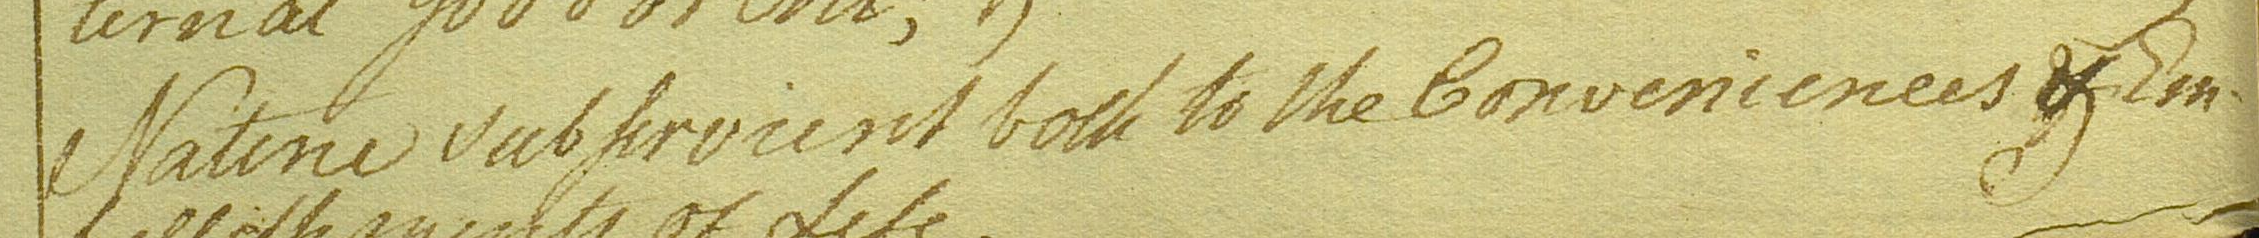Nature subservient both to the Conveniences & Em
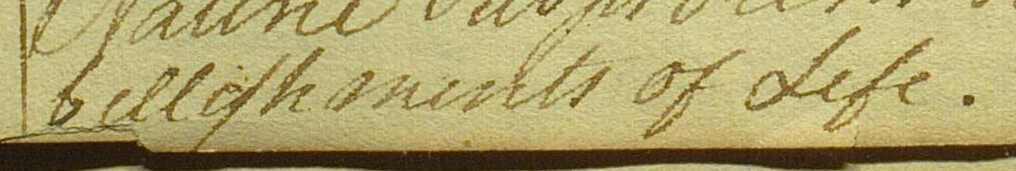bellishments of Life.
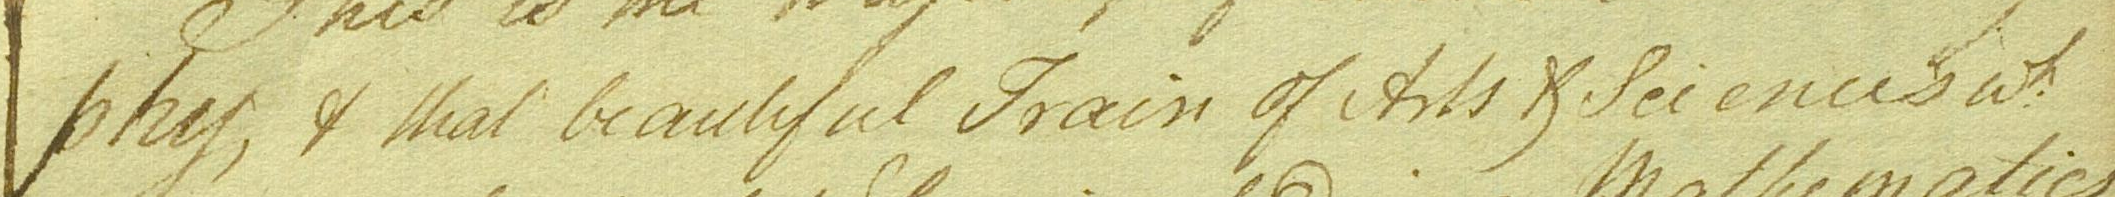phy, & that beautiful Train of Arts & Sciences w^h.
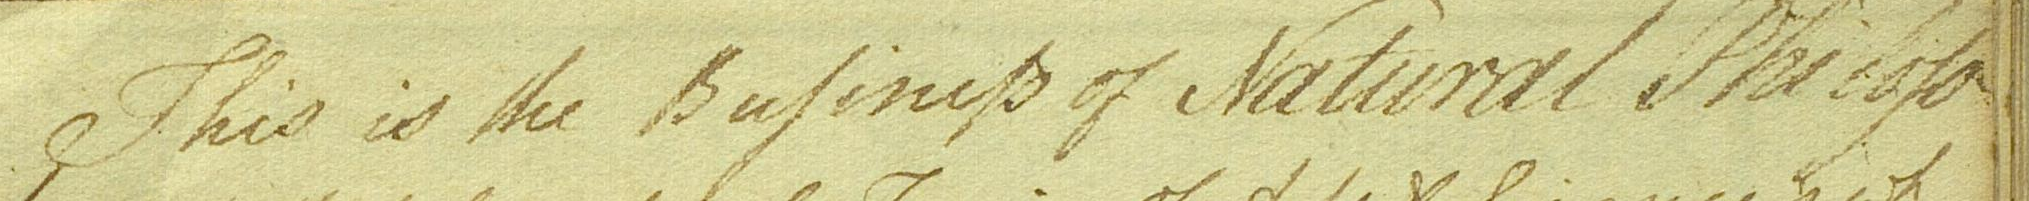This is the Business of Natural Philoso
